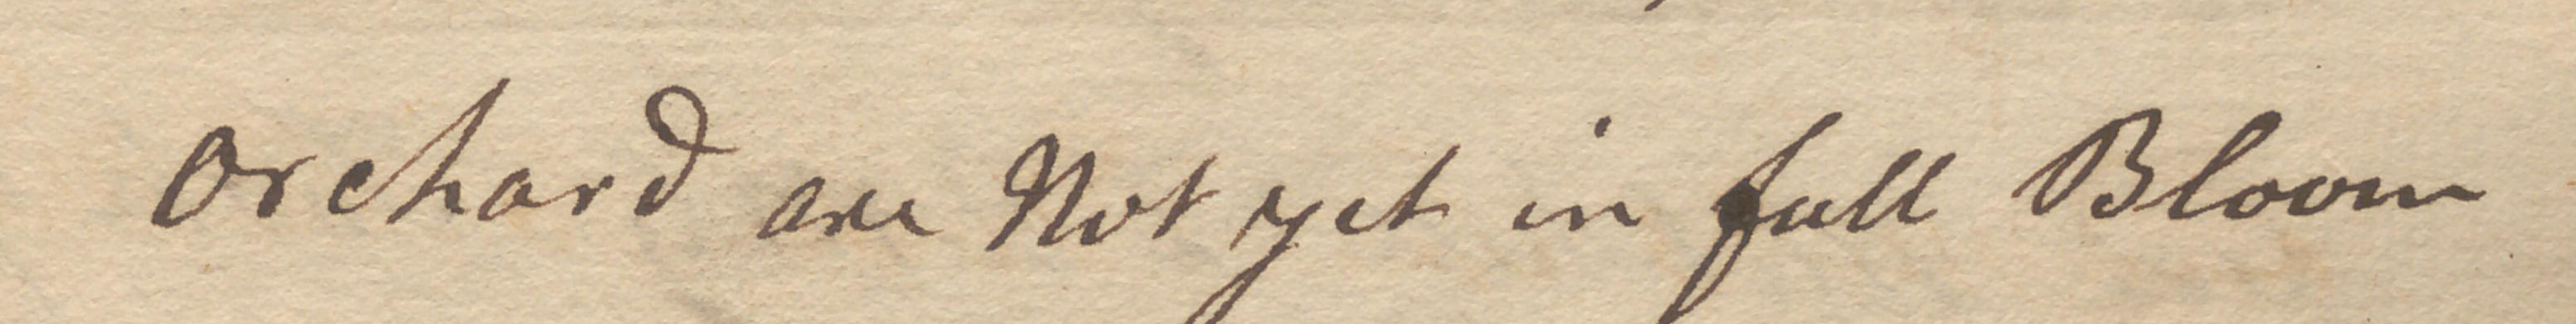orchard are Not yet in full Bloom
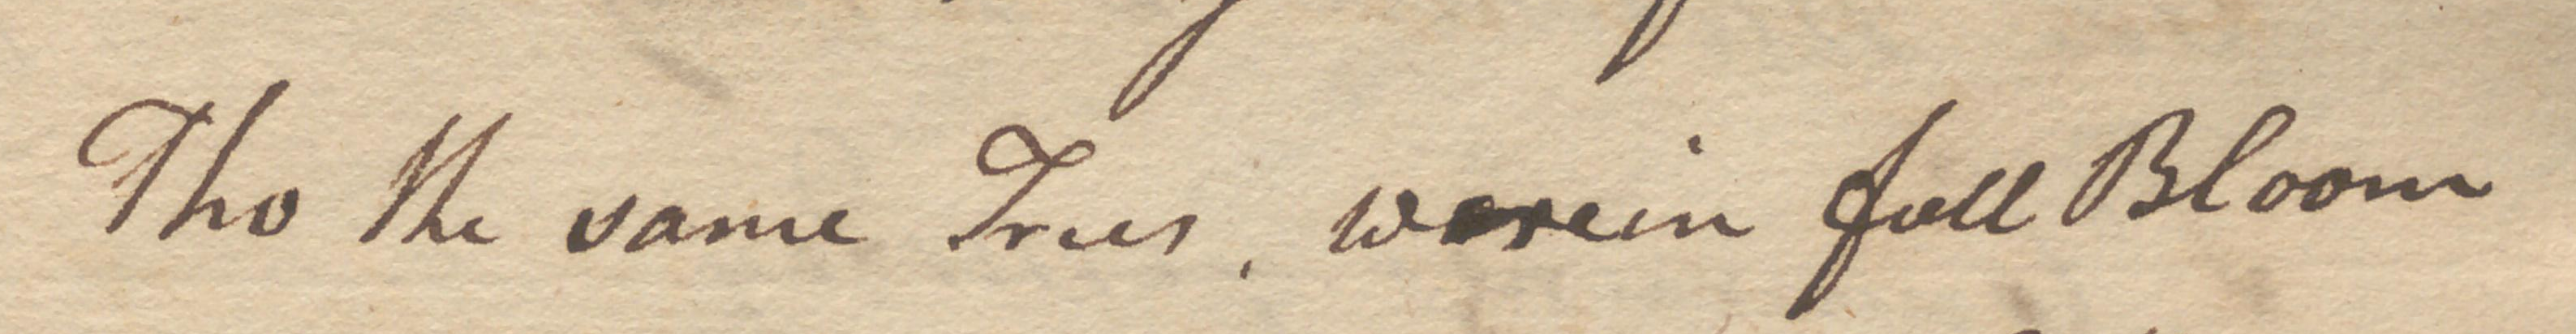Tho the same Trees were in full Bloom
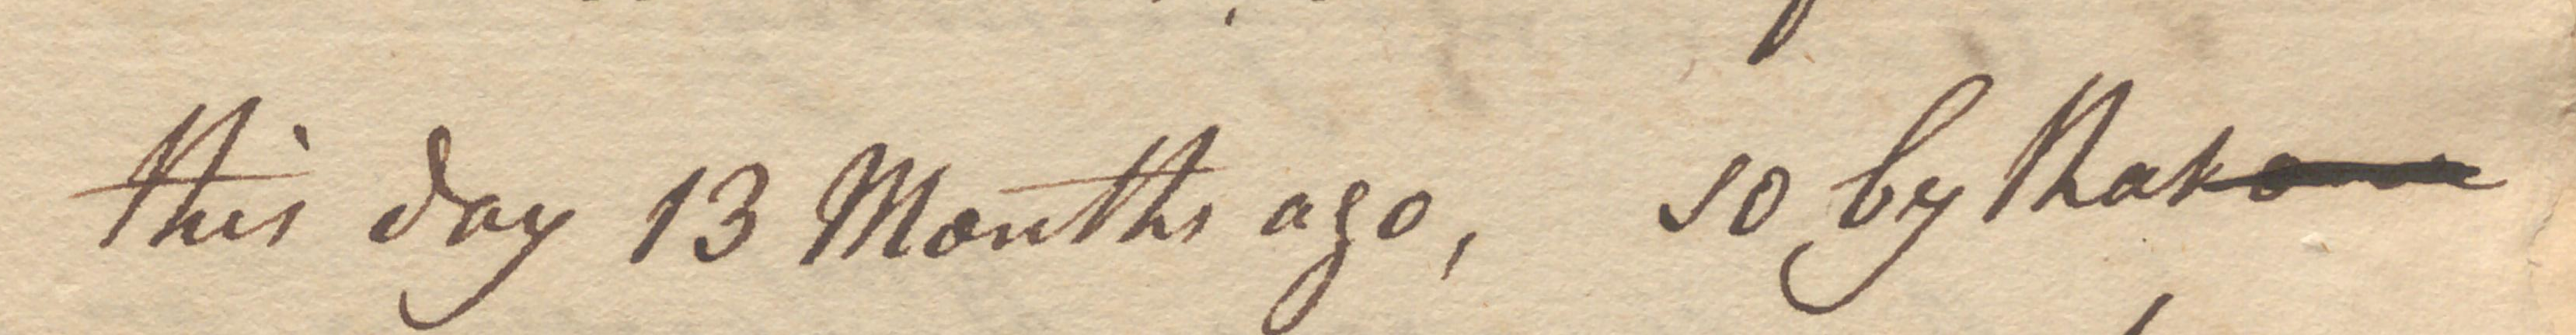this day 13 Months ago, so by that [one]
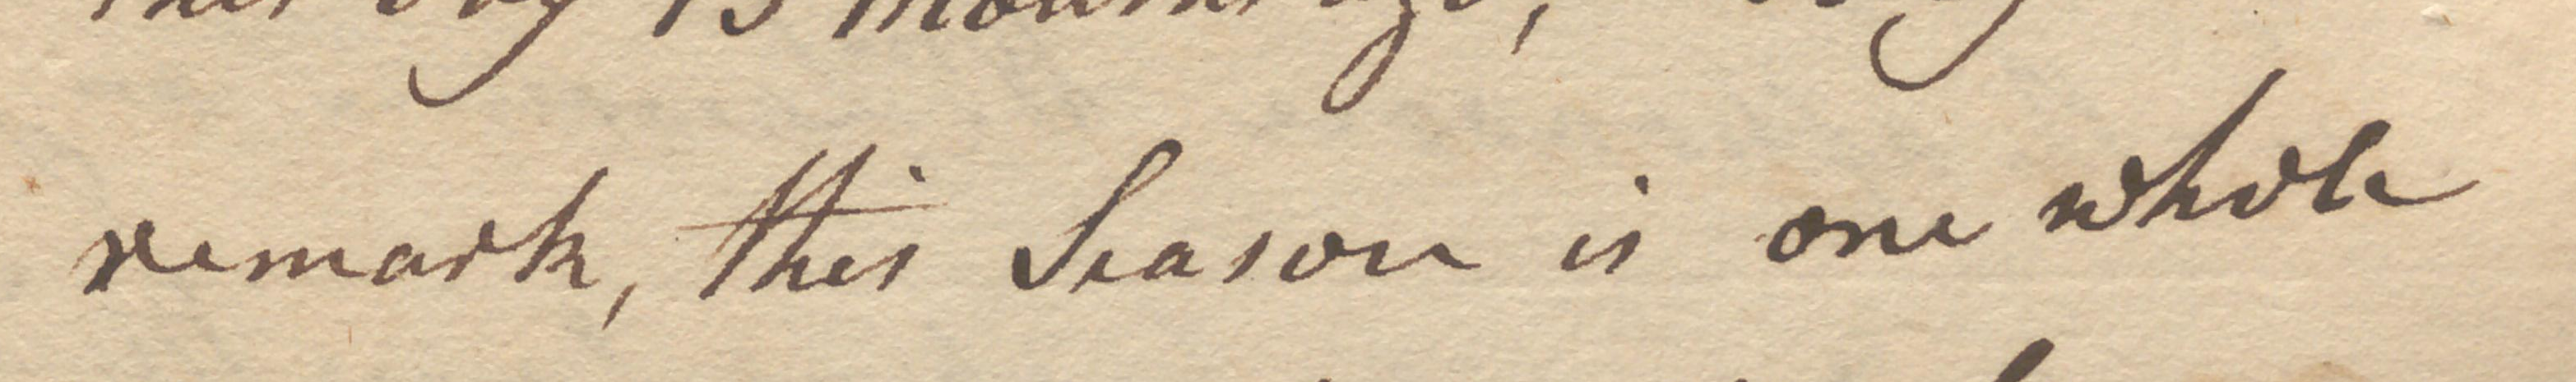remark, this Season is one whole
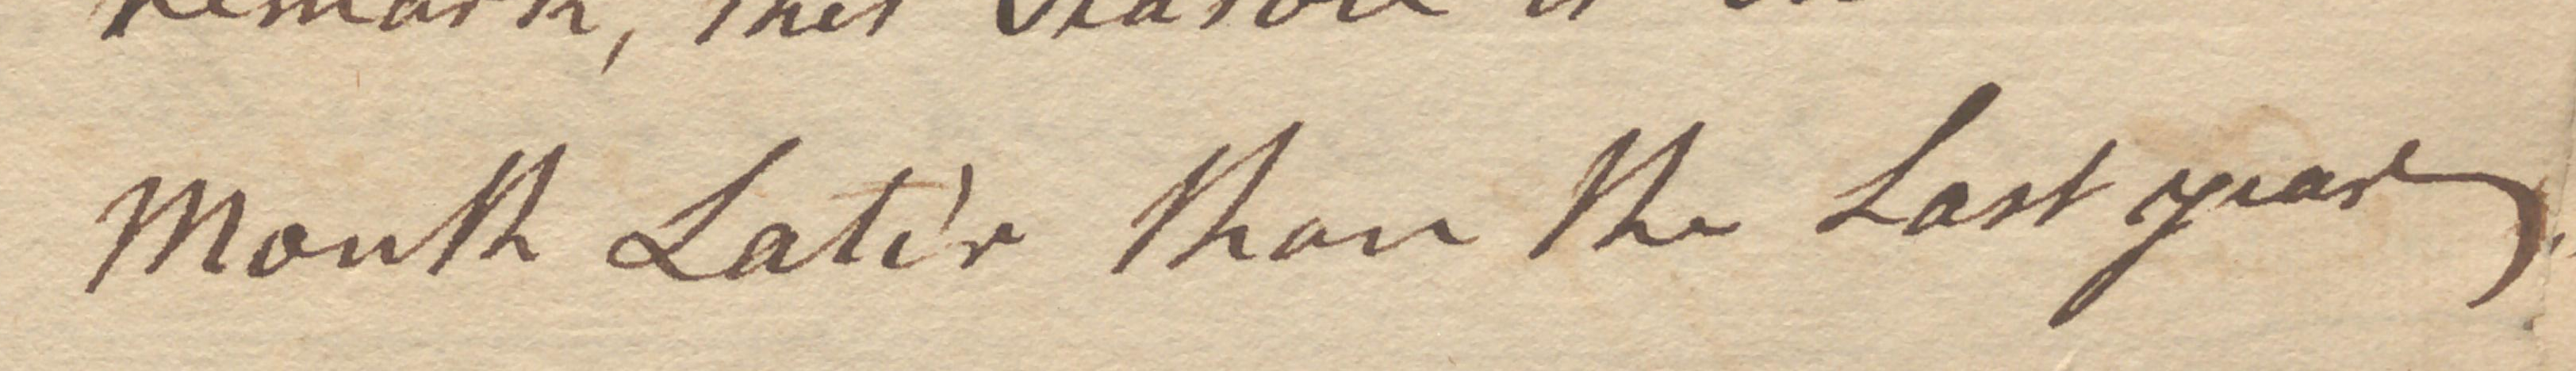Month Latee than the Last year
